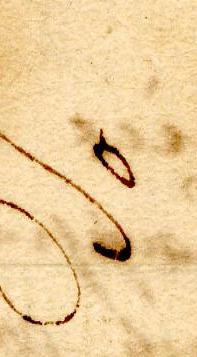To
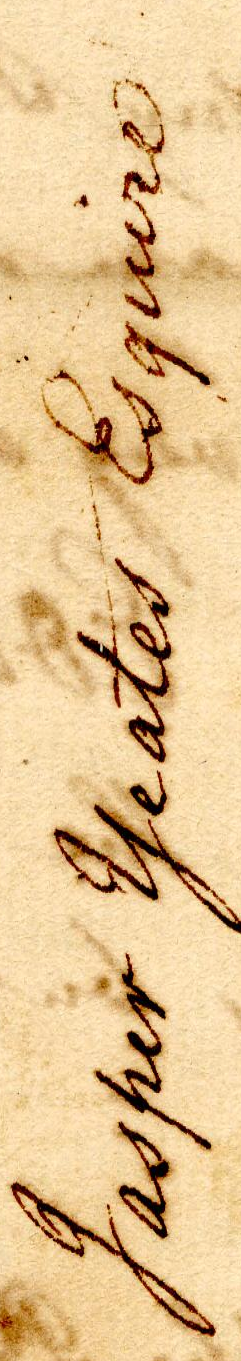Jasper Yeates Esquire
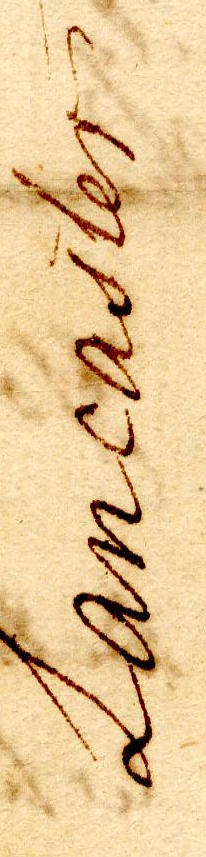Lancaster
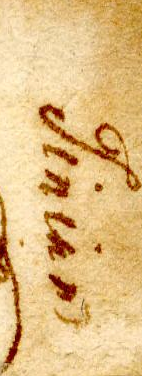Tinian
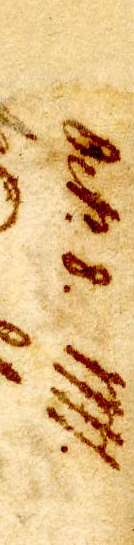Oct^r. 8. 1777.
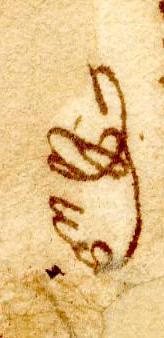Edw-
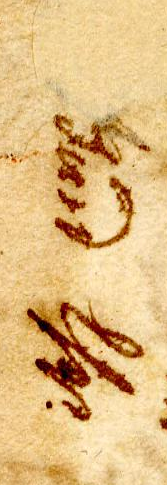Burd Esq^r.
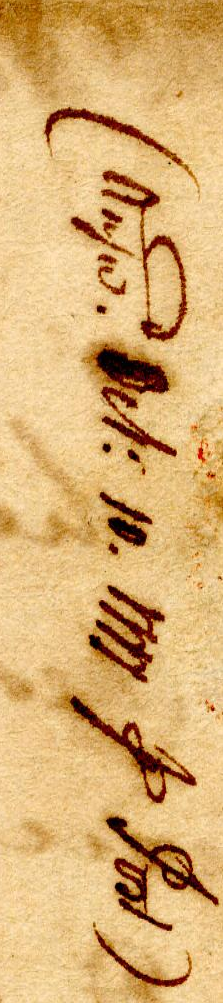(Answ^d. Oct: 10. 1777 per Post)
